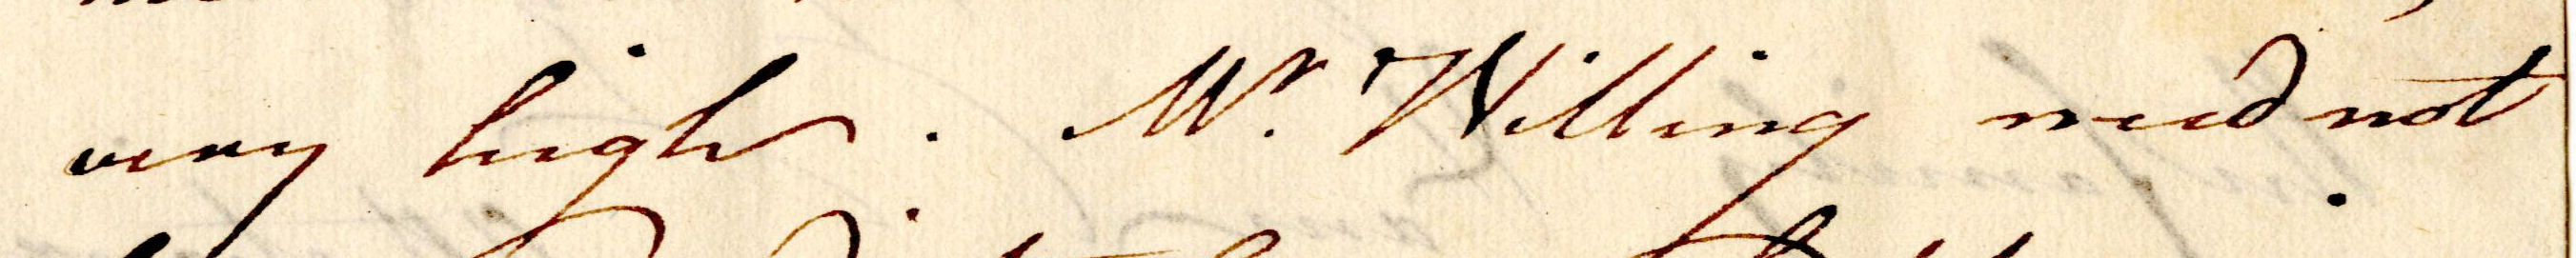very high. M^r. Willing need not
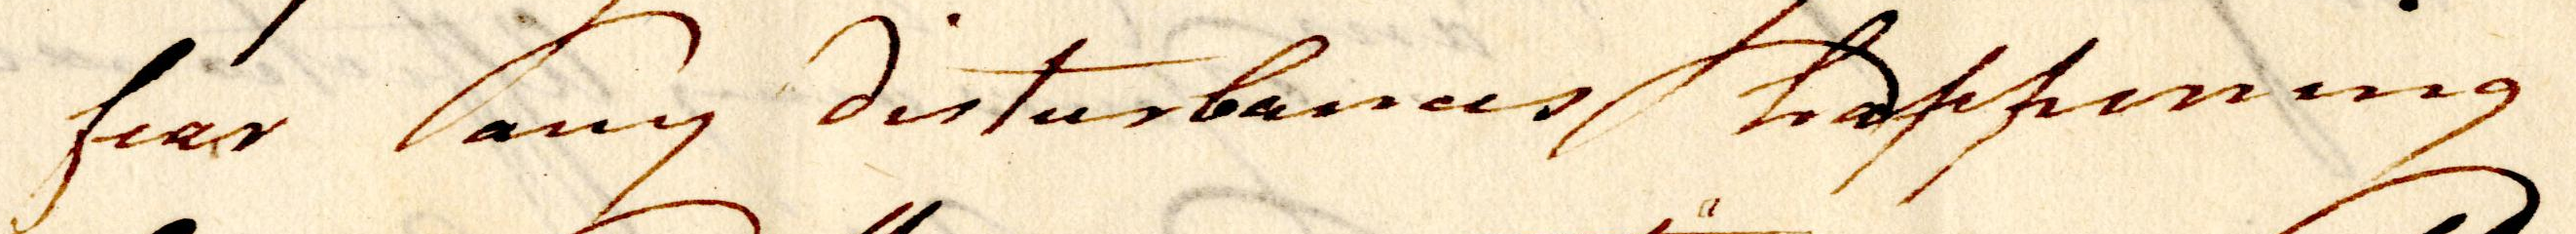fear any disturbances happening
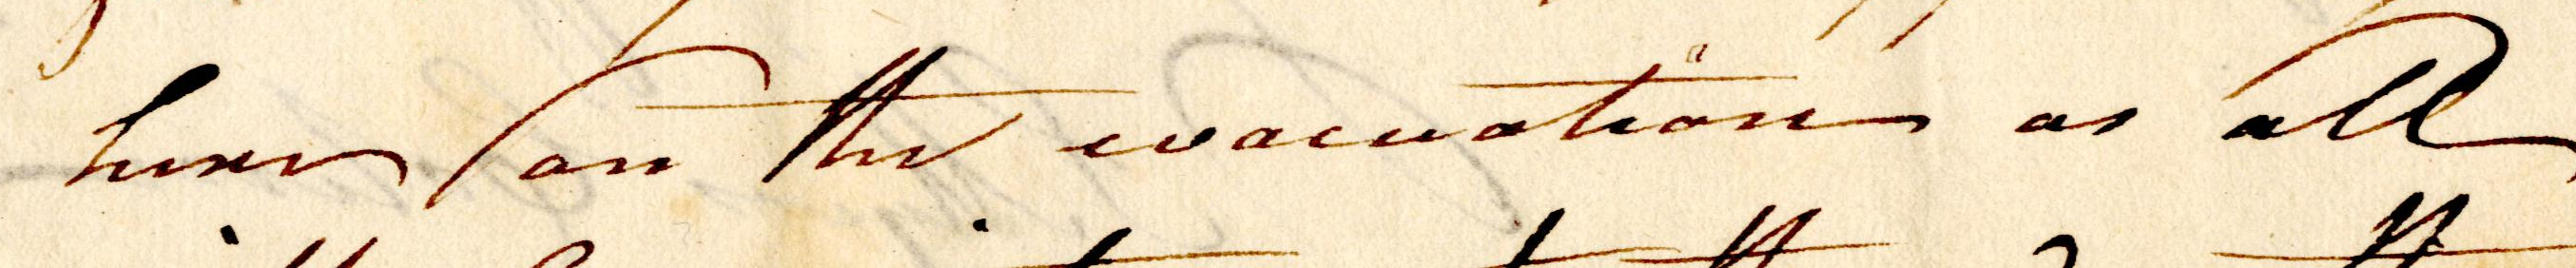here from the evacuation as all
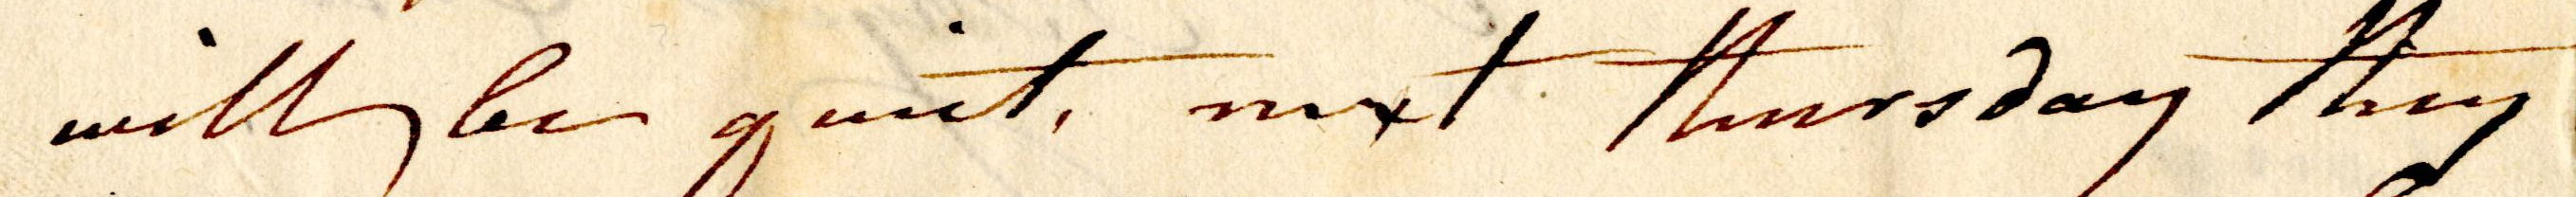will be quiet, next Thursday they
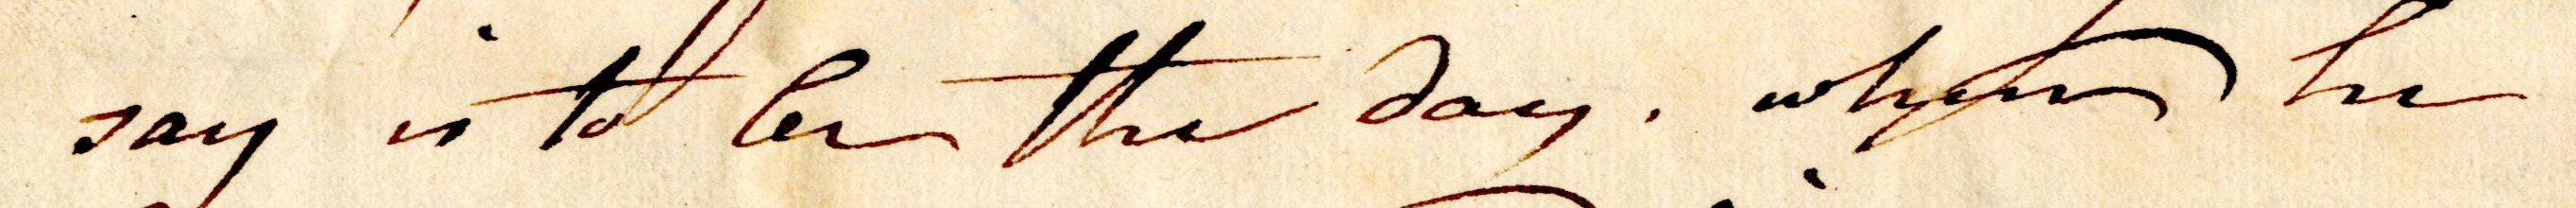say is to be the day. when he
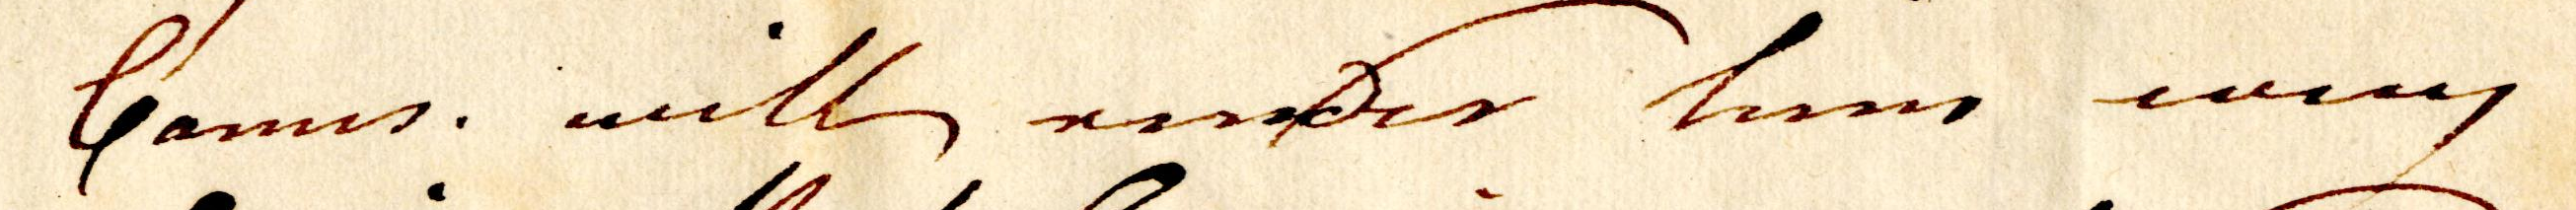Comes, will render his every
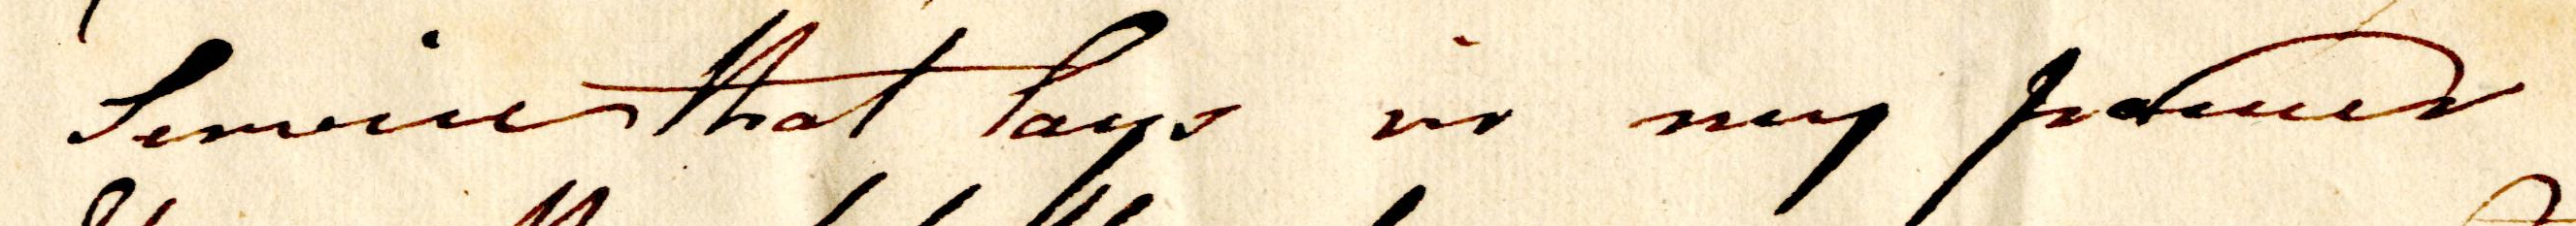service that lays is my product
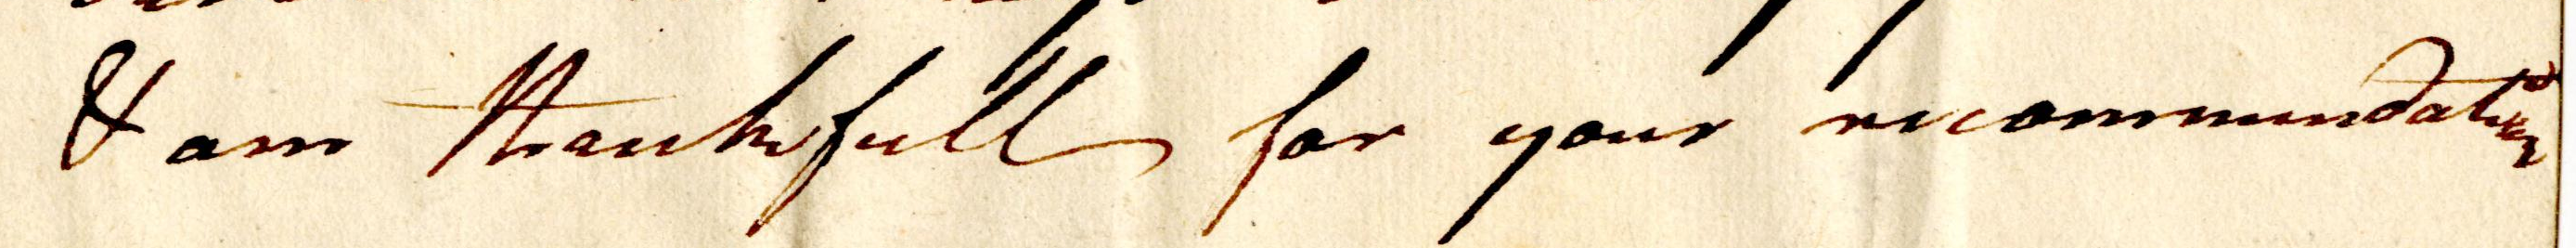& am thankfull for your recommendation
